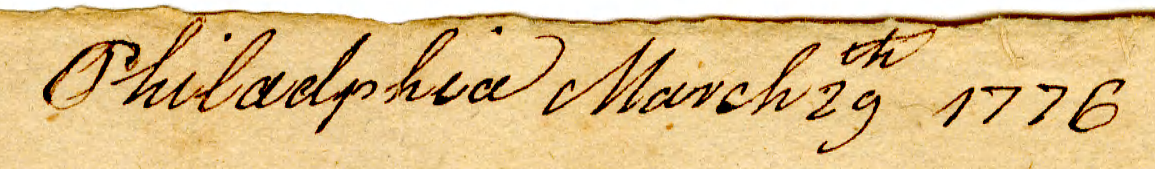Philadelphia March 29^th 1776
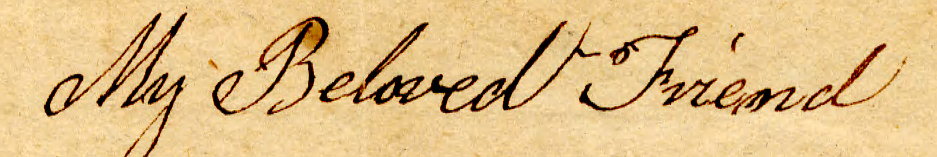My Beloved Friend
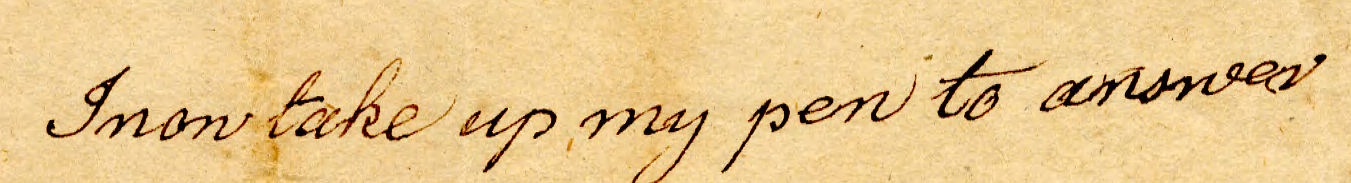I now take up my pen to answer
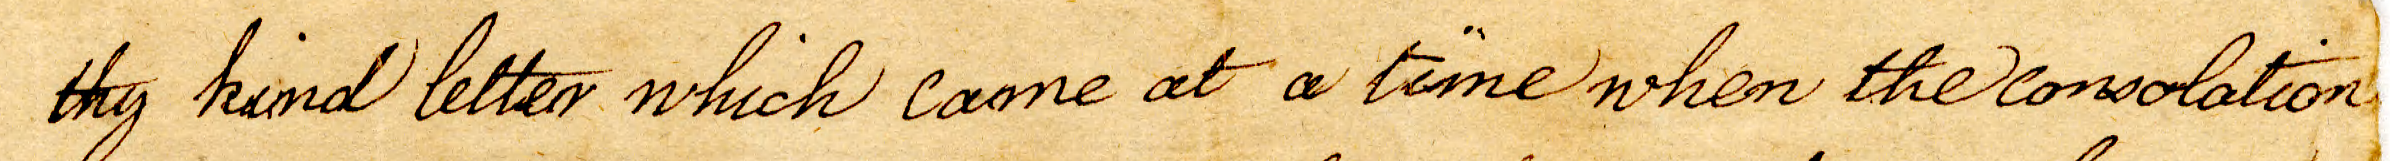thy kind letter which came at a time where the consolation
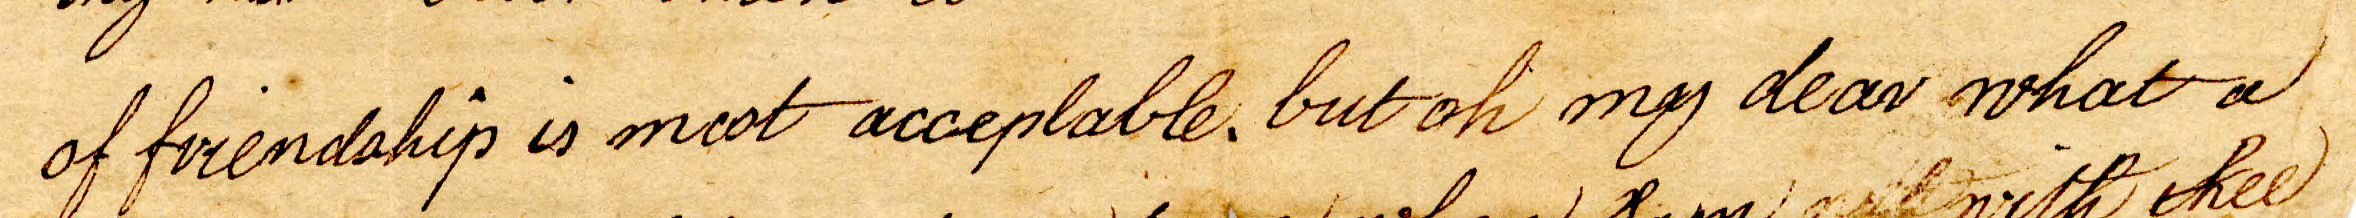of friendship is most acceptable, but oh my dear what a
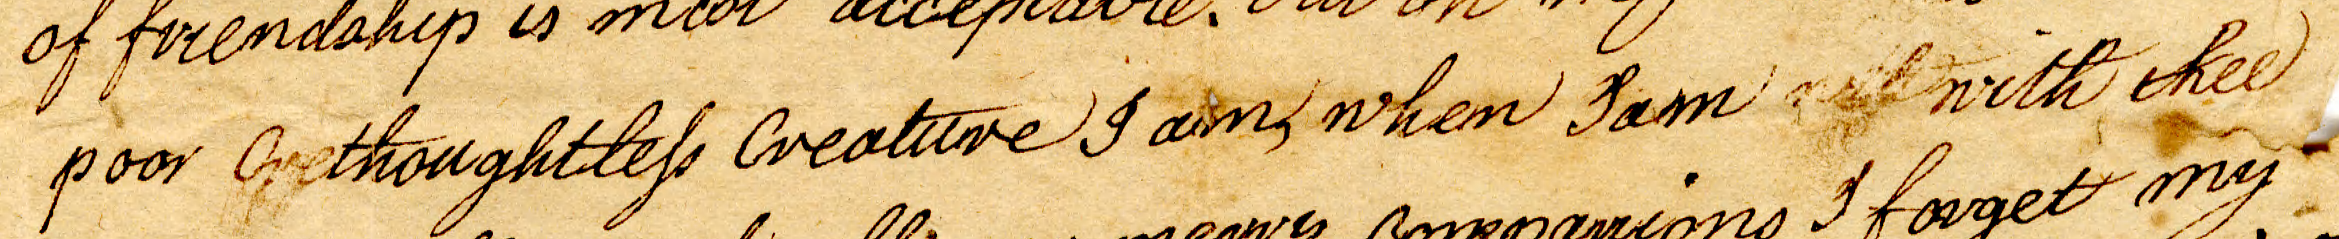poor thoughtless creature I am, when I am with thee
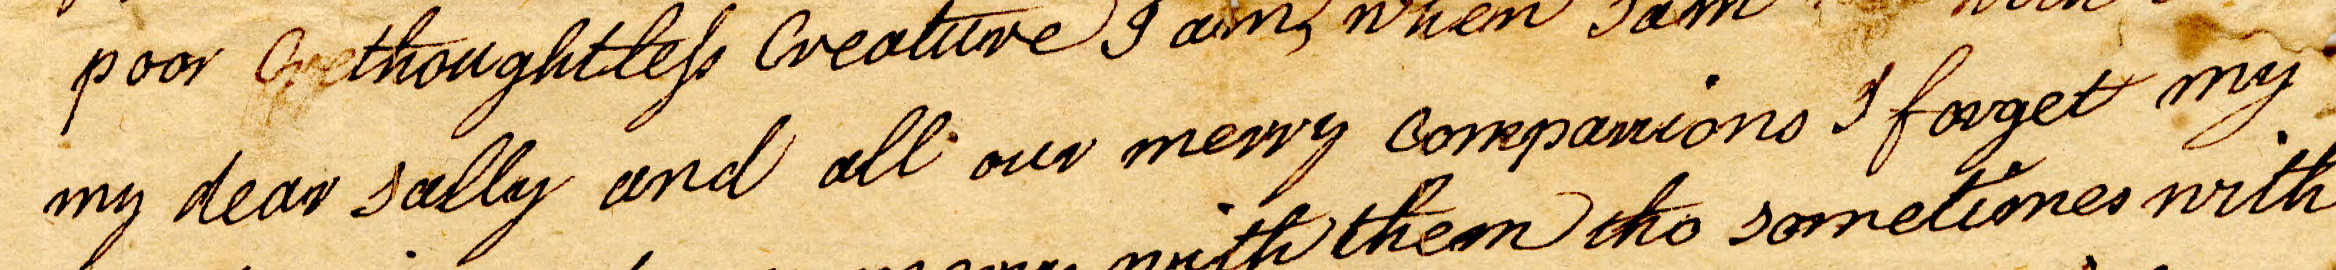my dear Sally and all our merry companions I forget my
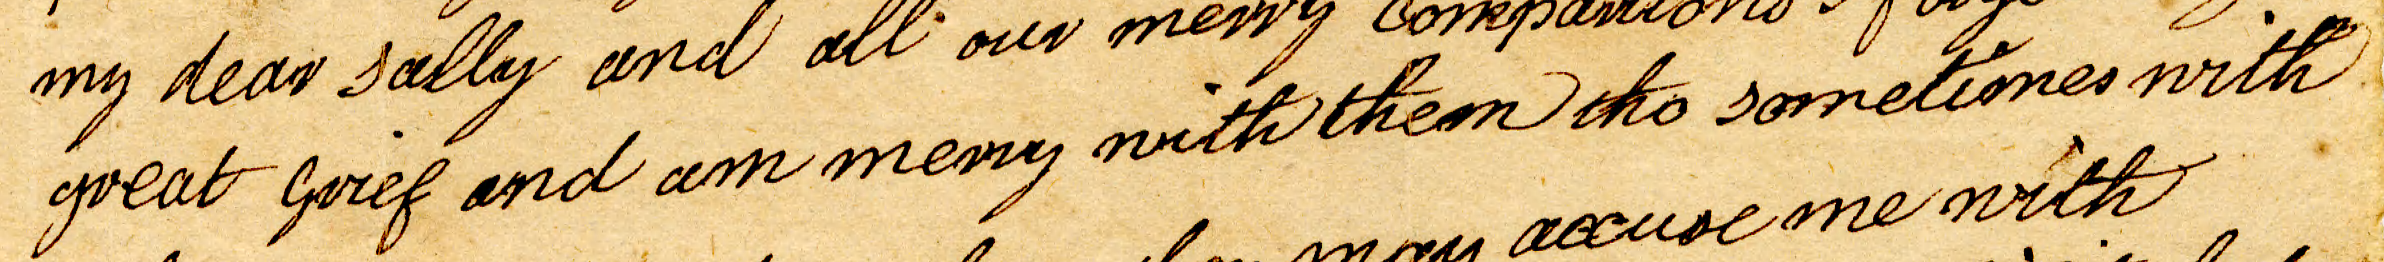great Grief and am merry with them tho sometimes with
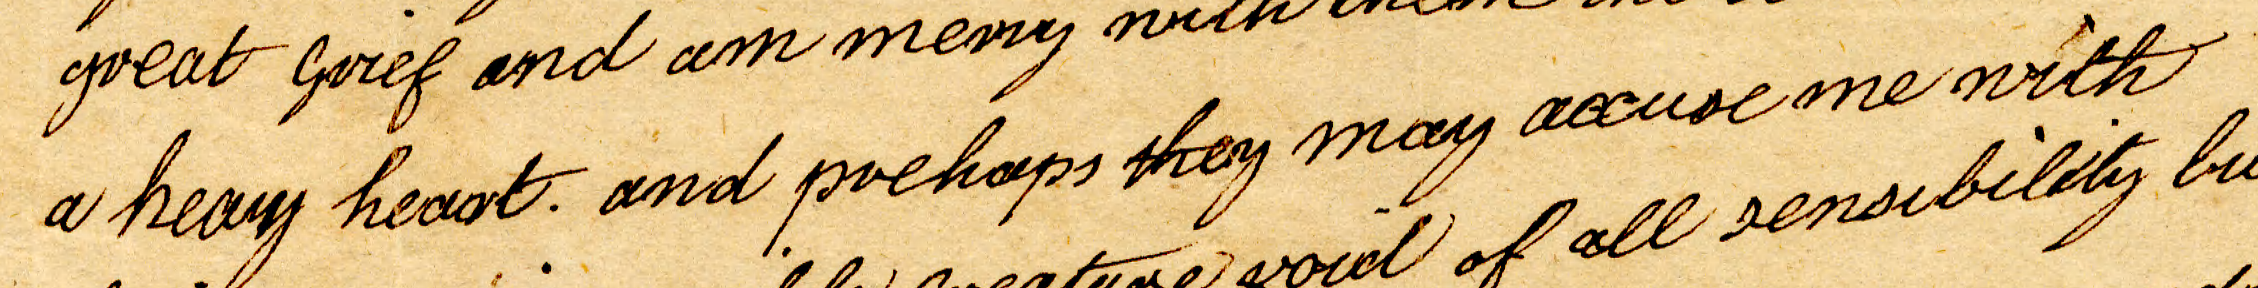a heavy heart and prehaps they may excuse me with
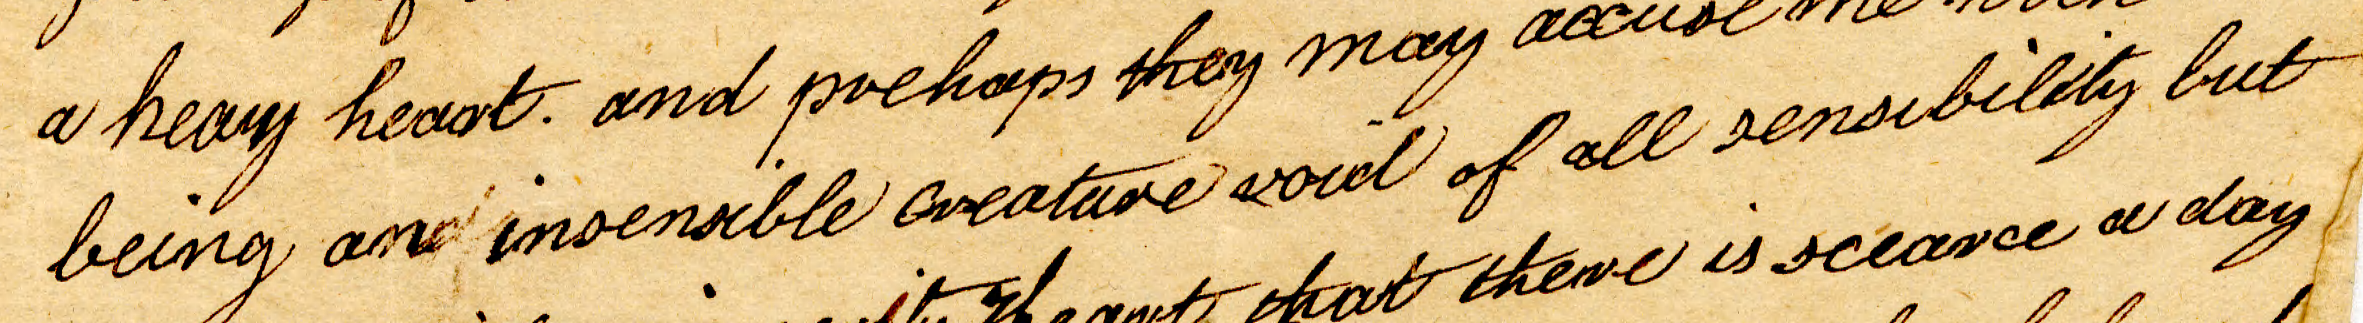being an insensible creature void of all sensibility but
